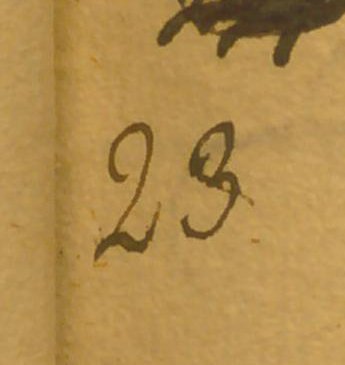23
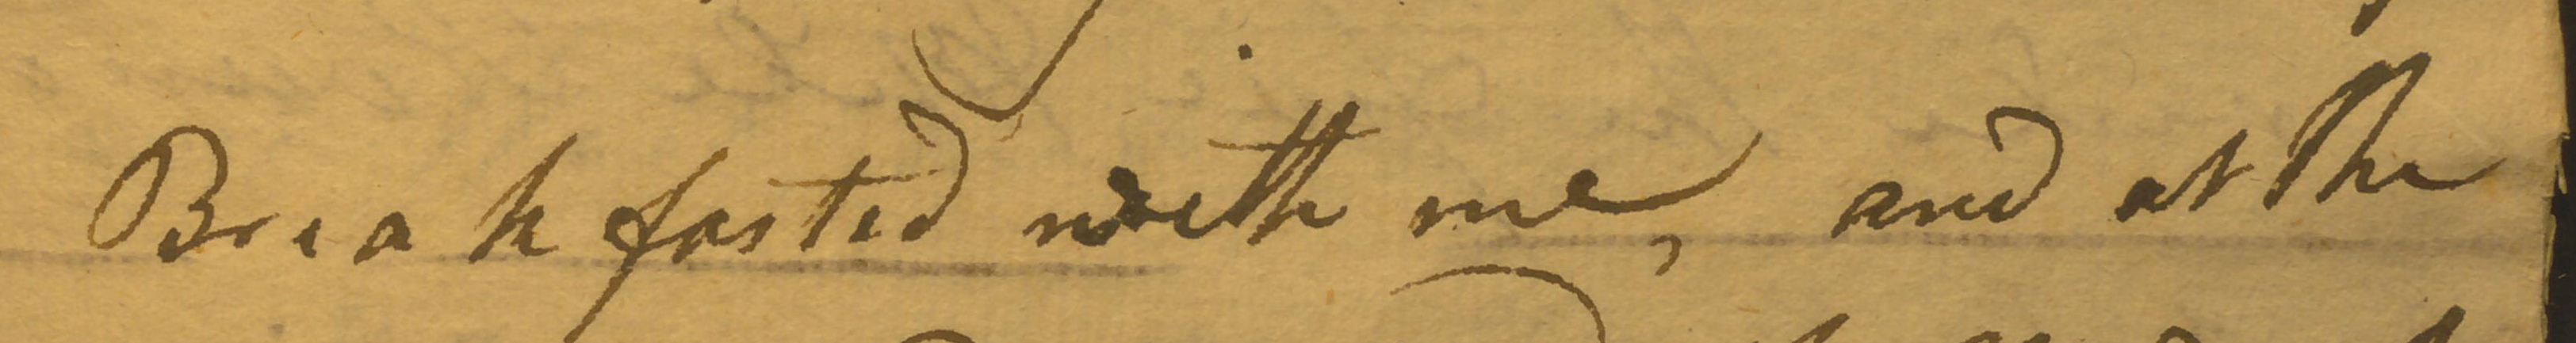Breakfasted with me, and at the
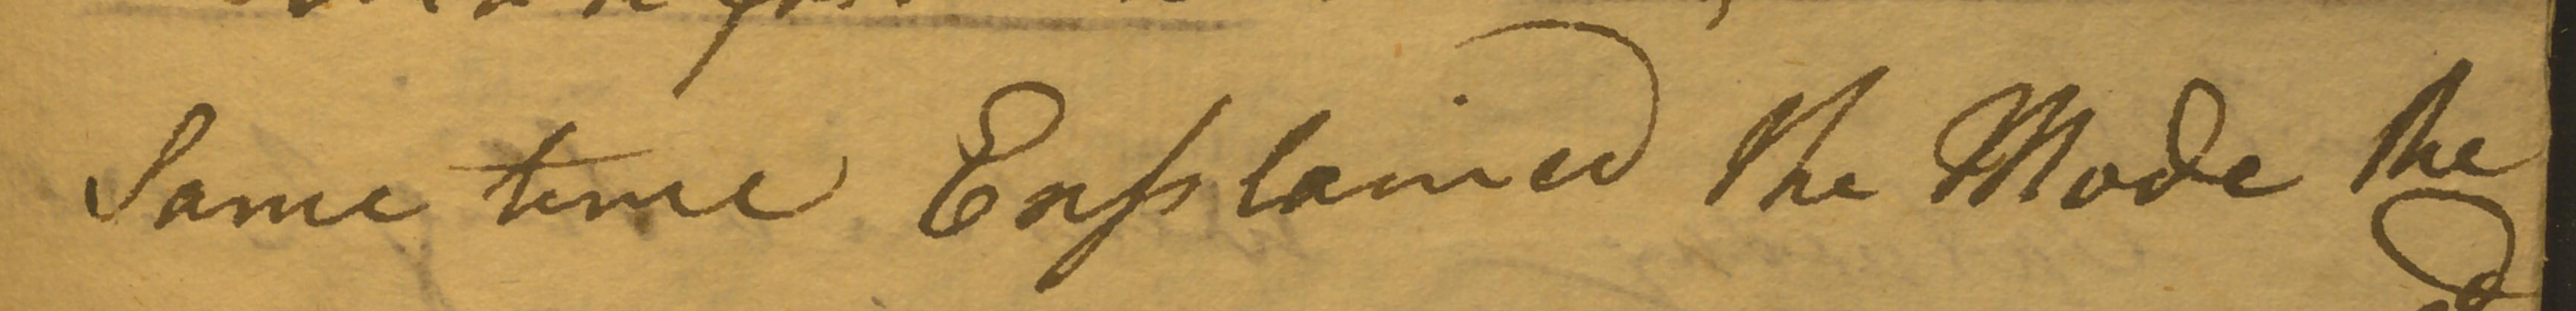same time Explained the Mode the
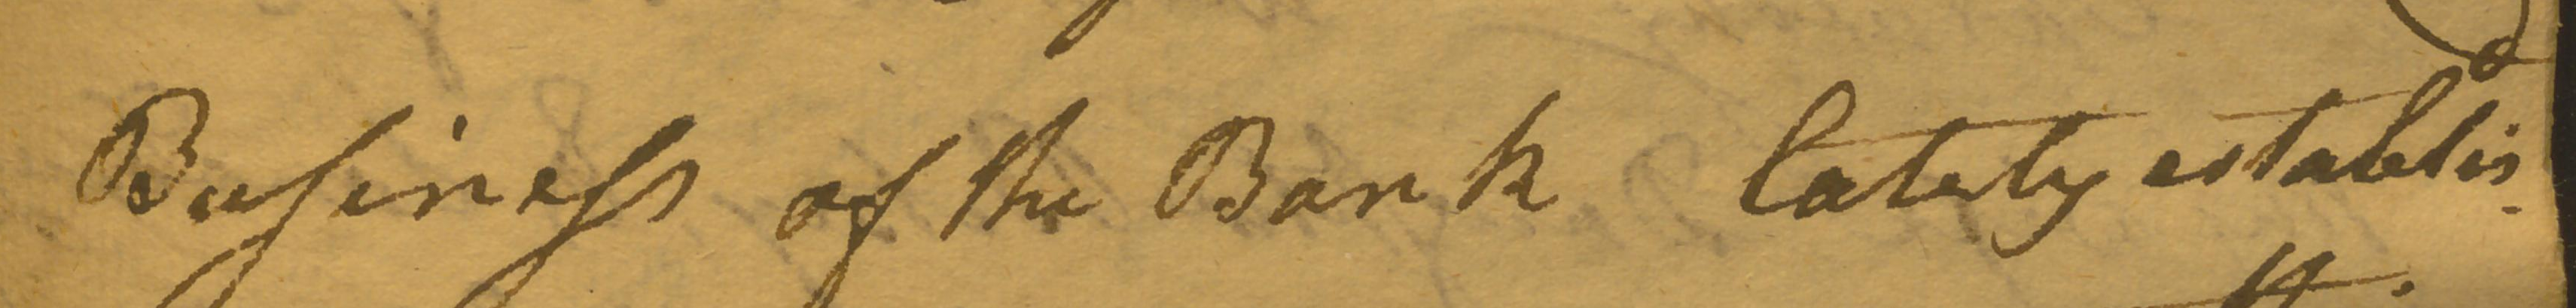Business of the Bank lately establis^d
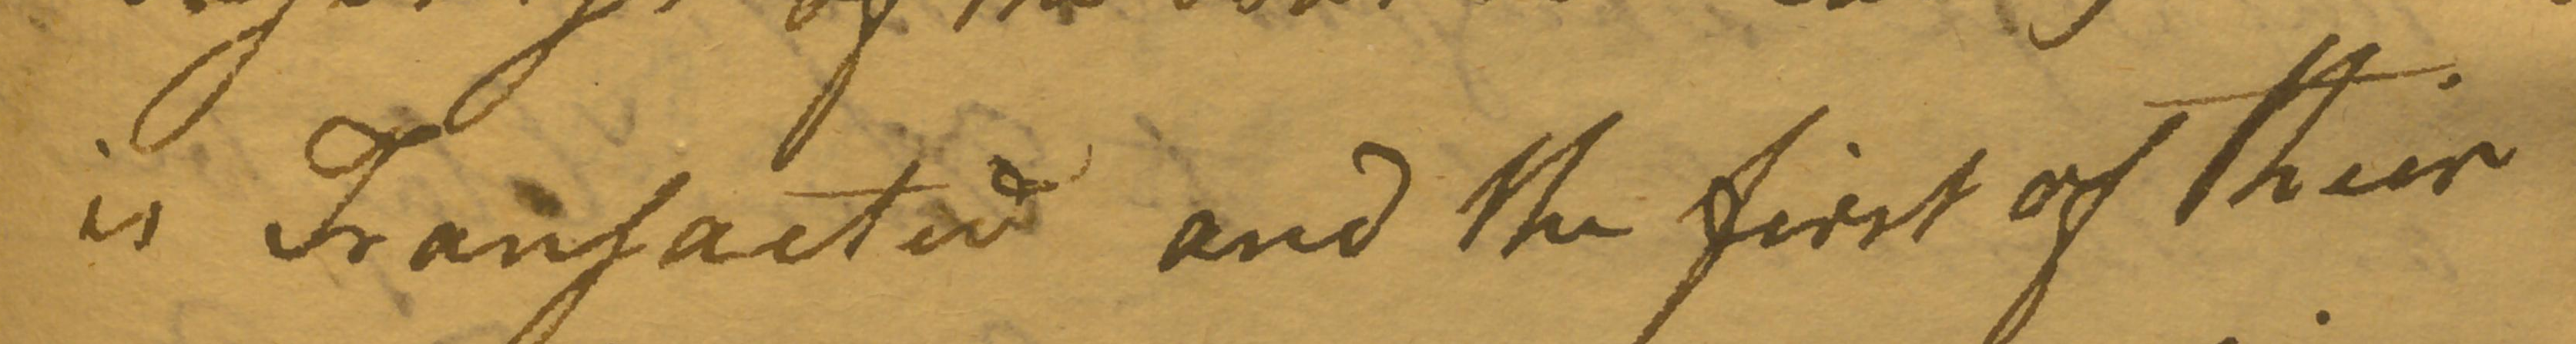is Transacted and the first of their
